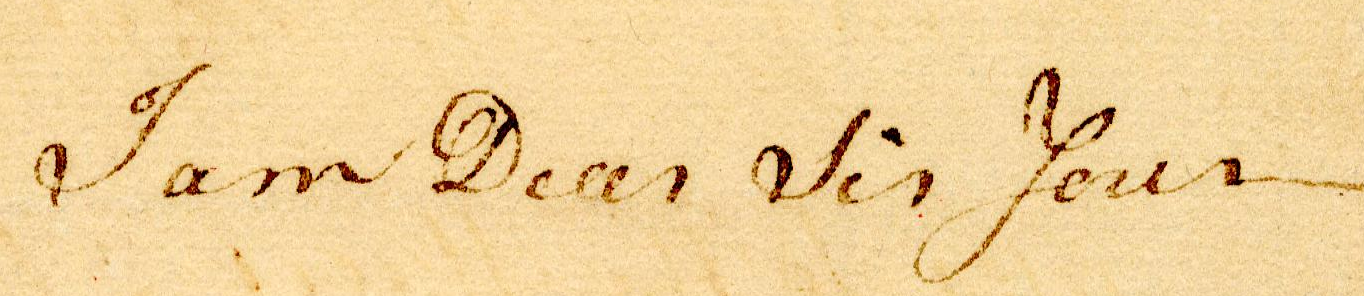I am Dear Sir Your
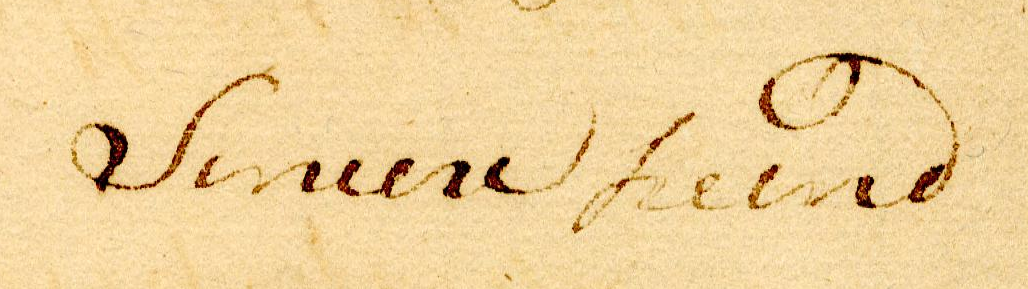Sincere friend
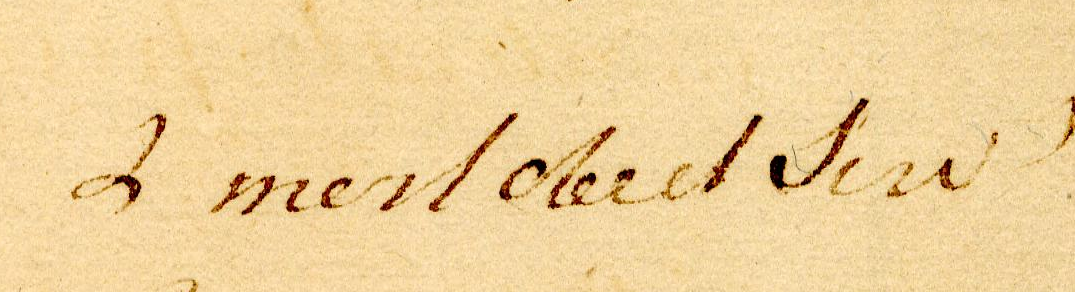& most obed Serv
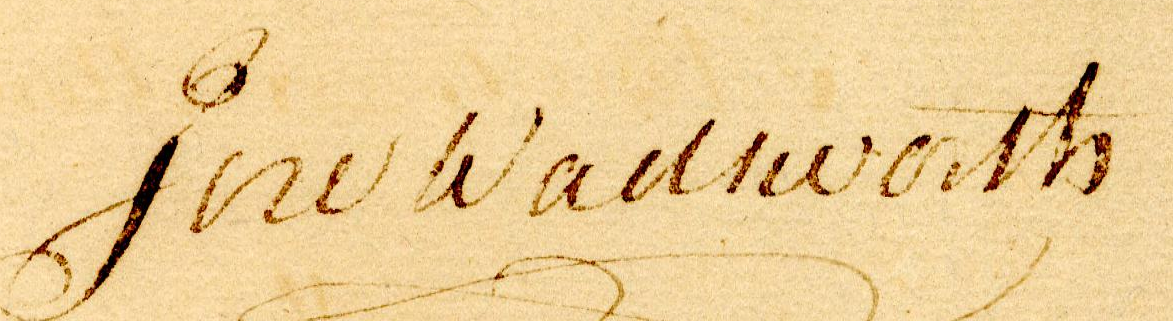Jere Wadsworth
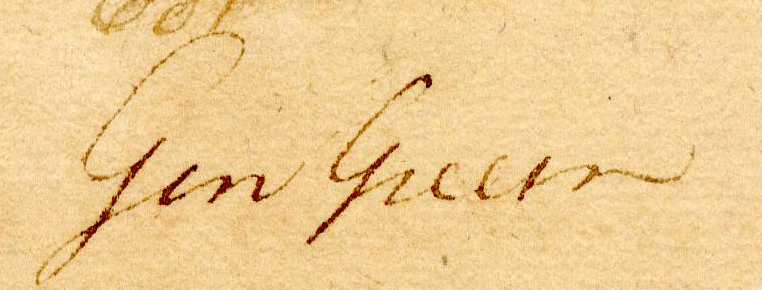Gen Green
